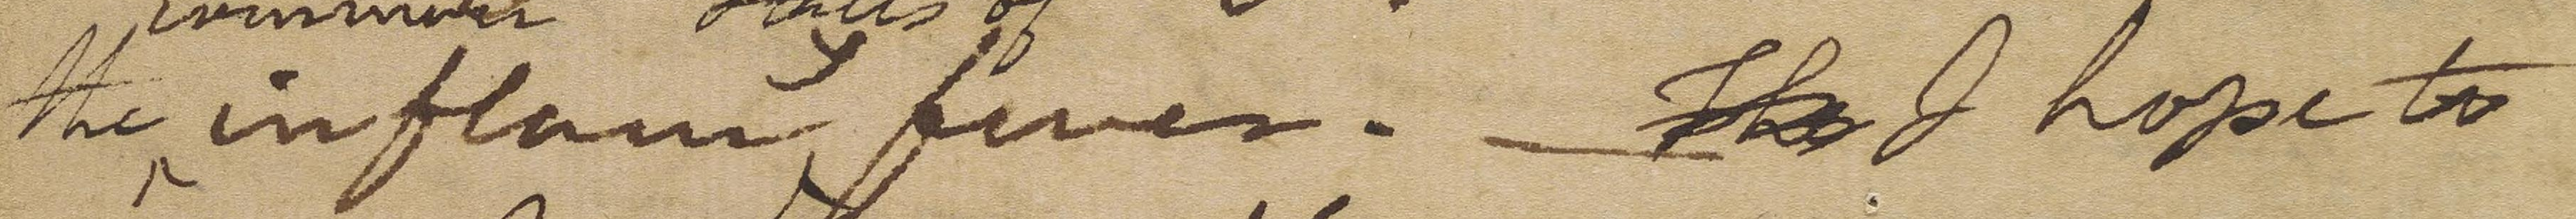the ^ inflam^y ^ fever.- [The] I hope to
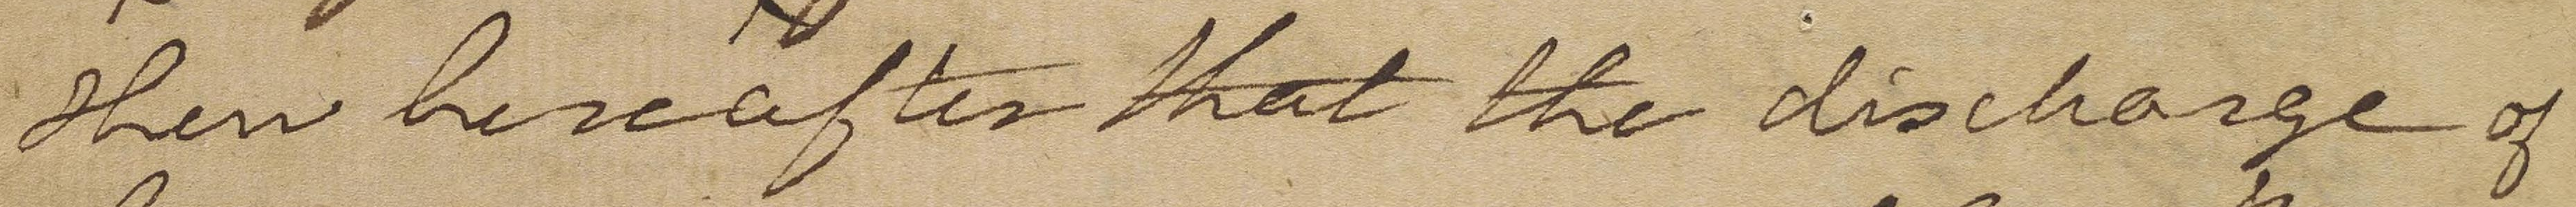shew hereafter that the discharge of
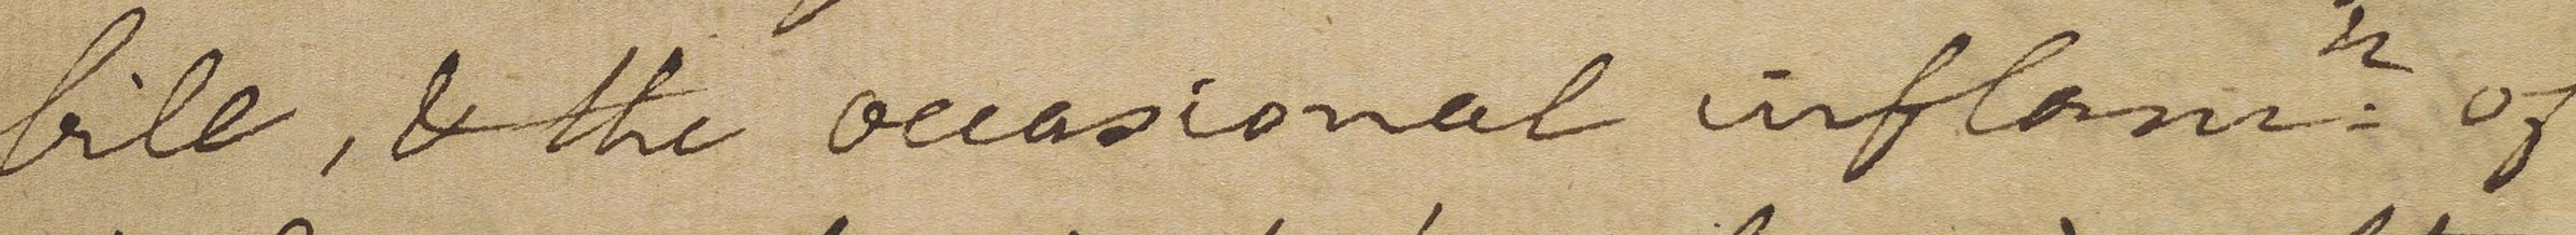bile, & the occasional inflam^n of
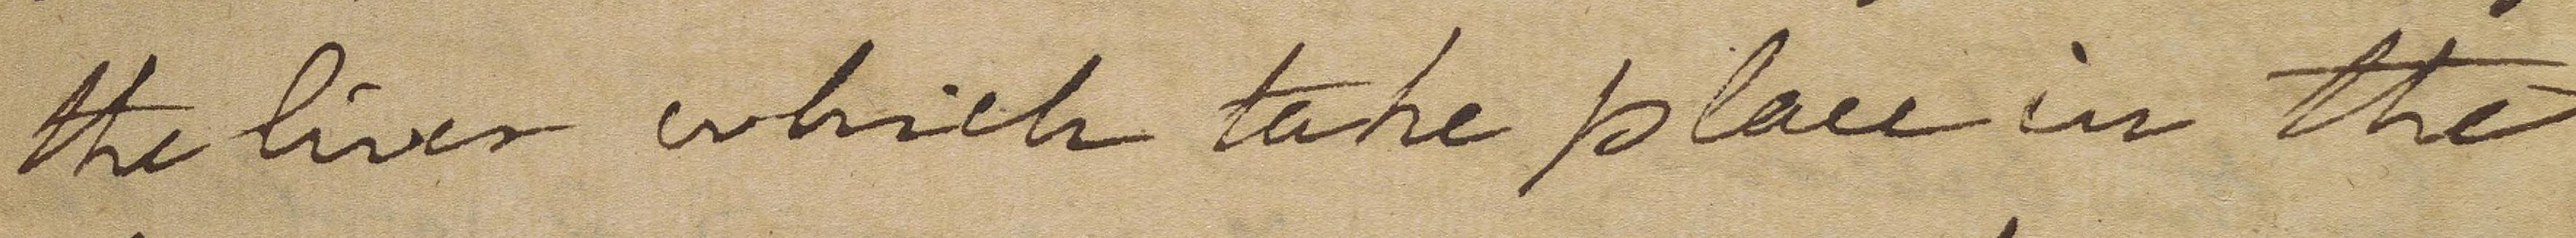the liver which take place in the
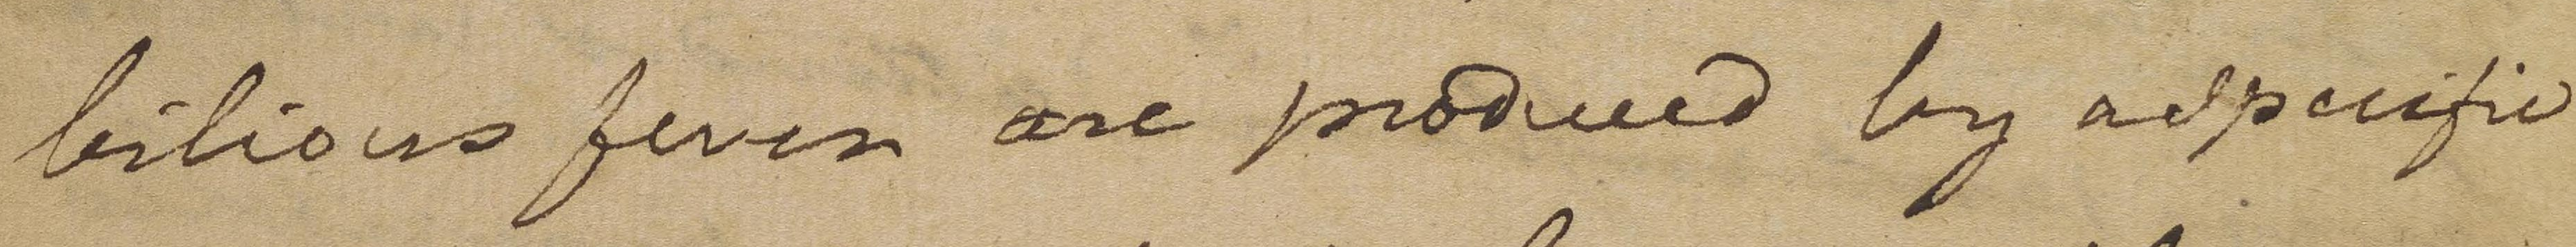bilious fever are produced by a specific
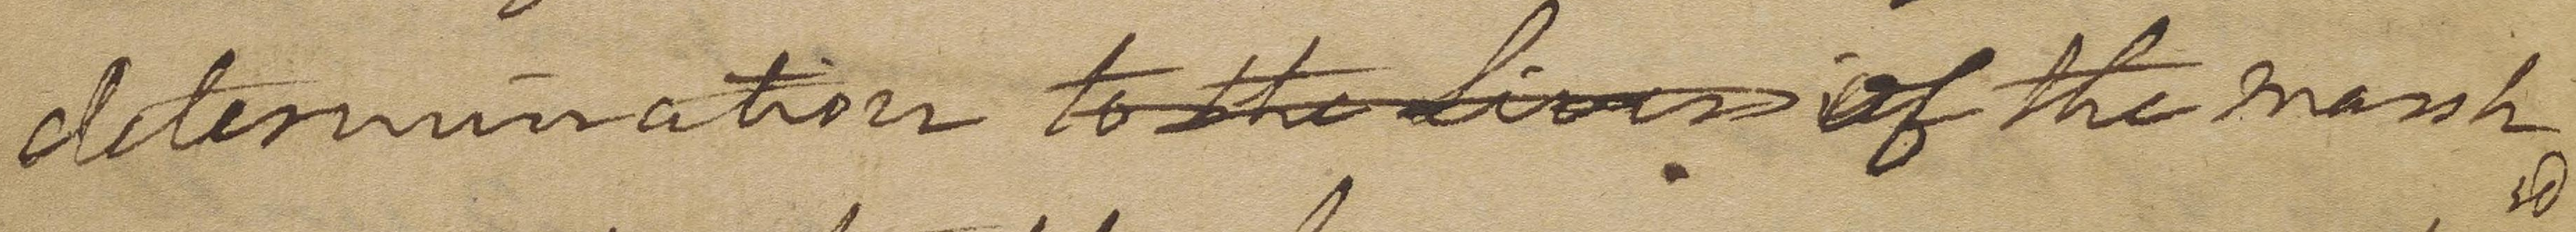determination [to the Liver] of the marsh
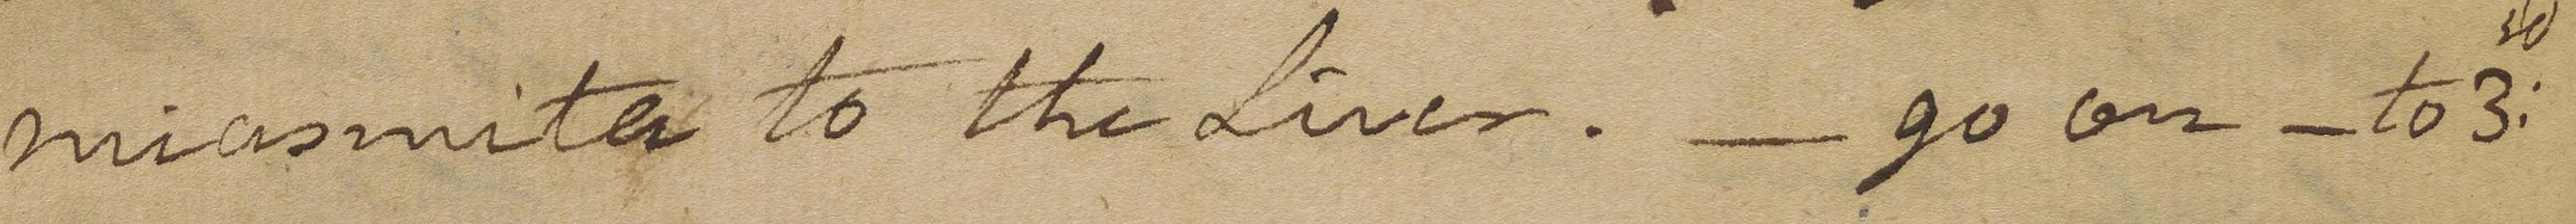miasmata to the Liver. - go on - to 3^d
